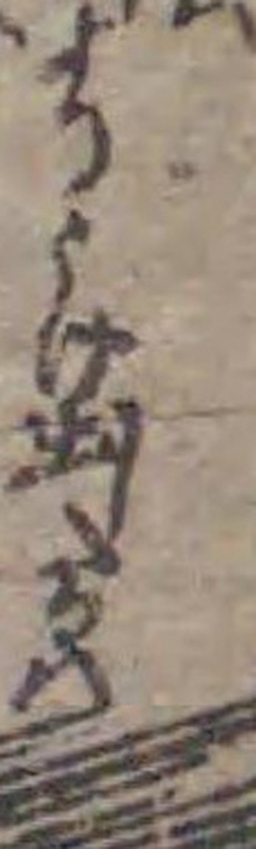うけ出したるは
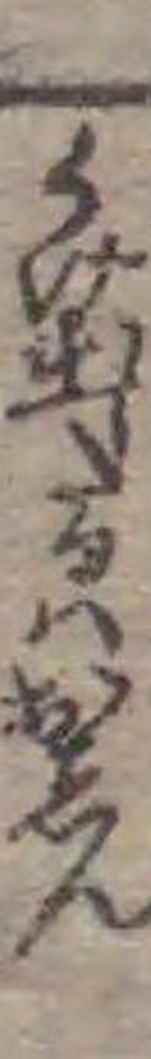うけ出したるはおしん
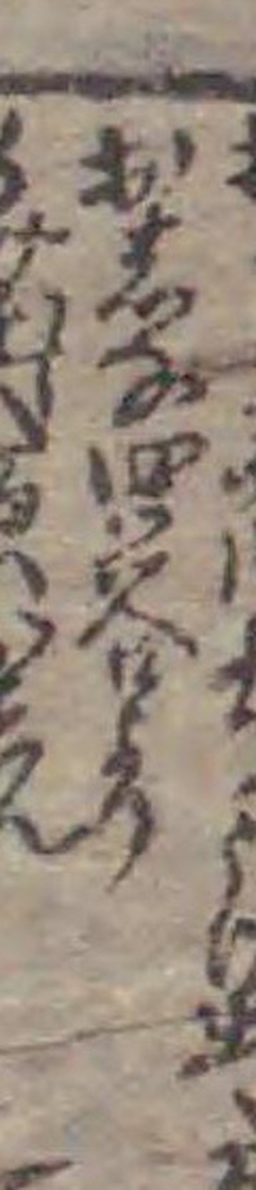うけ出したるは
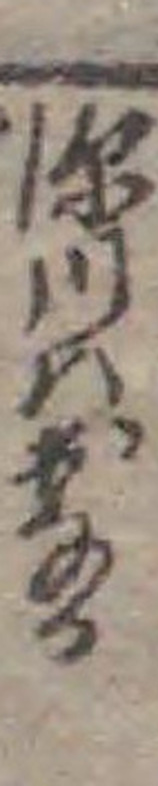深川はおなか
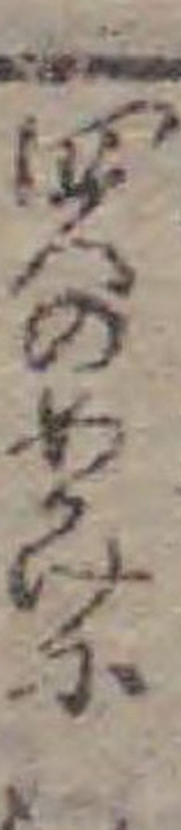四人のめかけに
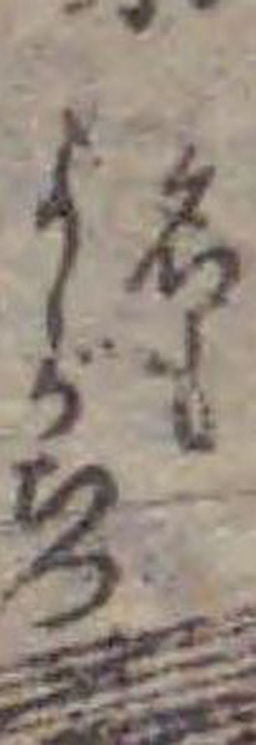よしがちつ
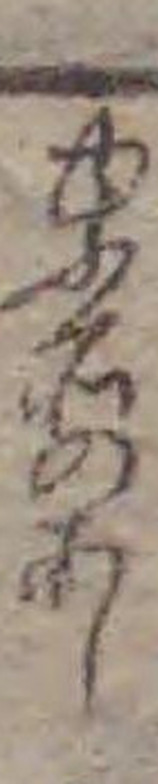ゆふ所のあし
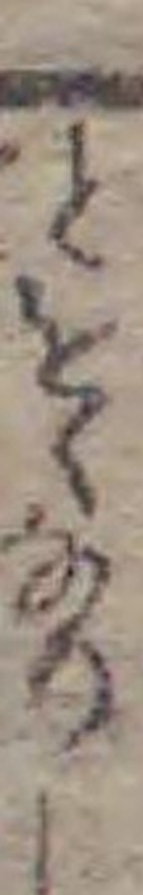とをくなり
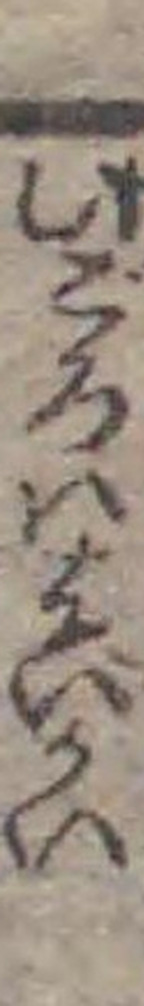此ごろははいかい
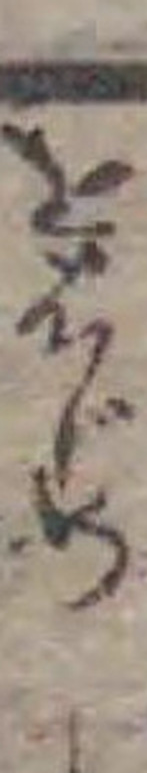をはじめ
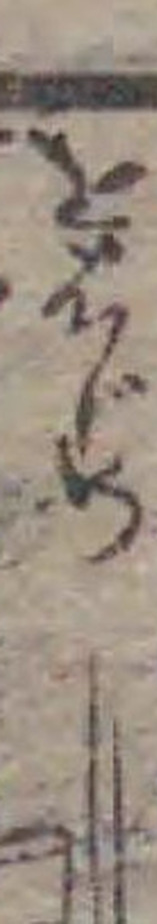をはじめ
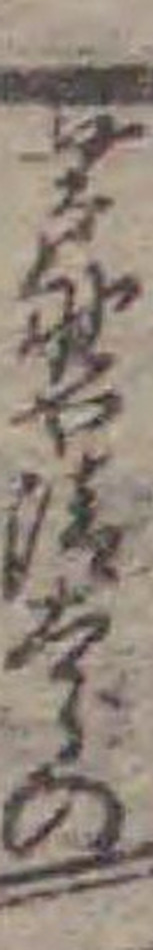芦野や清太郎の
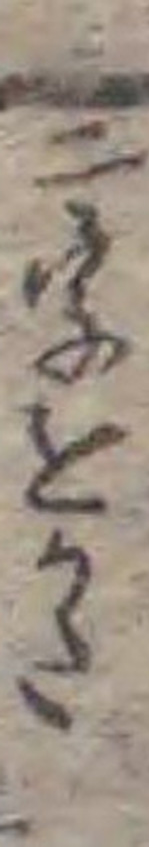二字をかた
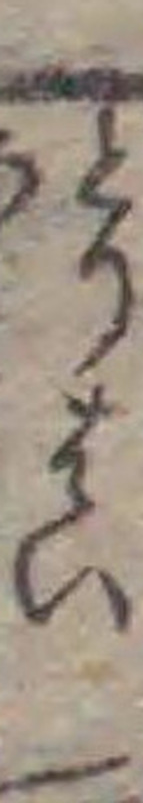とりはい
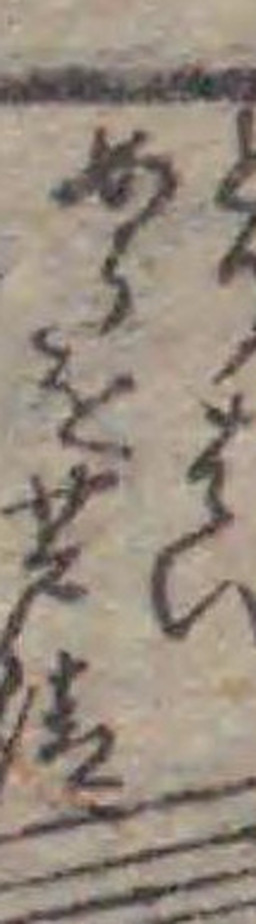めうを芦清
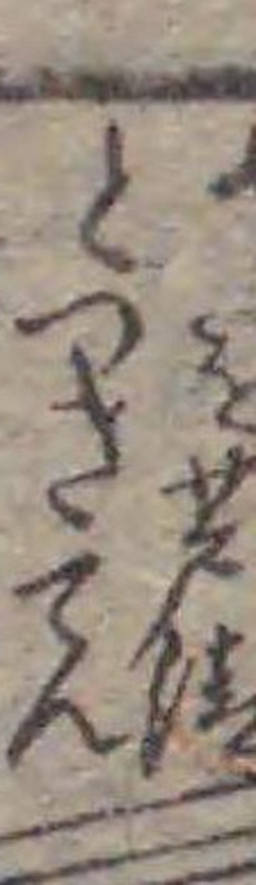とつきてん
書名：見徳一炊夢 : 3巻
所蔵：国立国会図書館 National Diet Library, JAPAN
